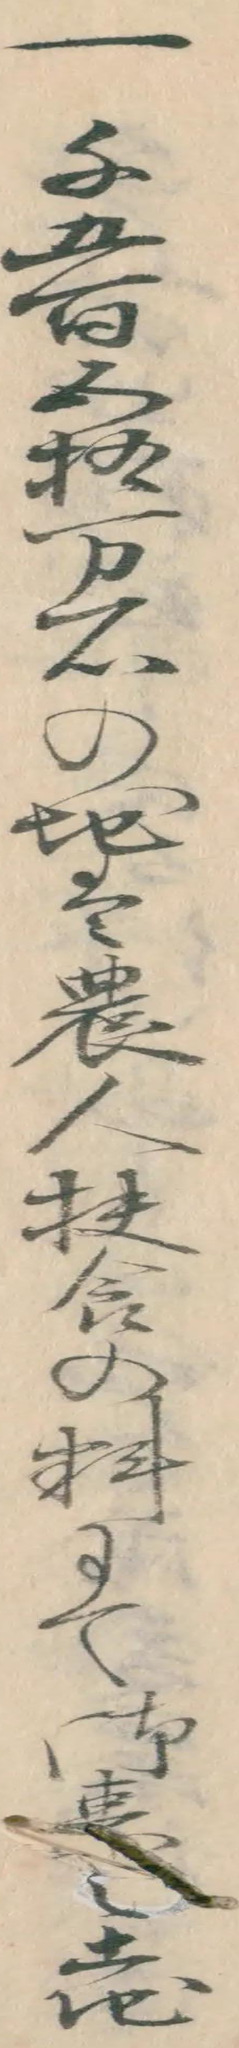一千五百五拾万石の地は農人扶食の料にて御恵之土地

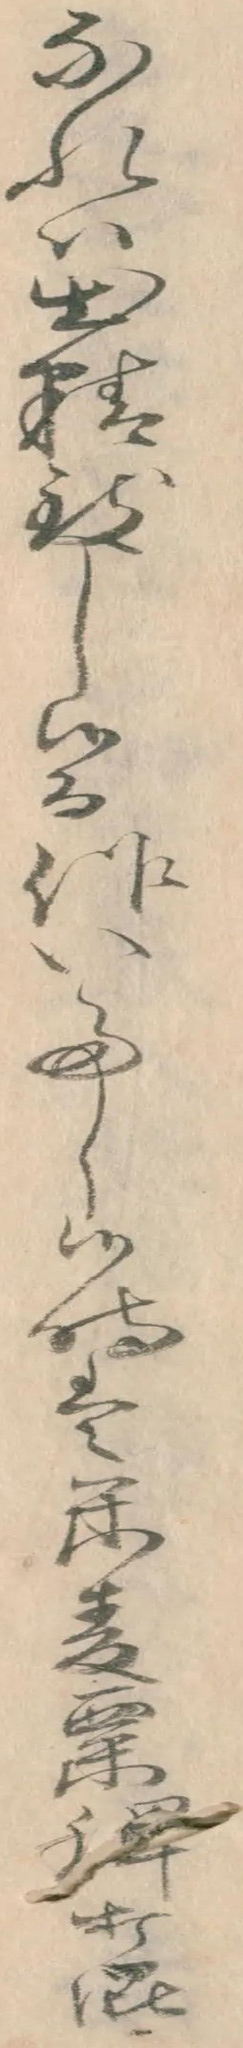なれは出精致し候而作いたし候時は米麦粟稗打混
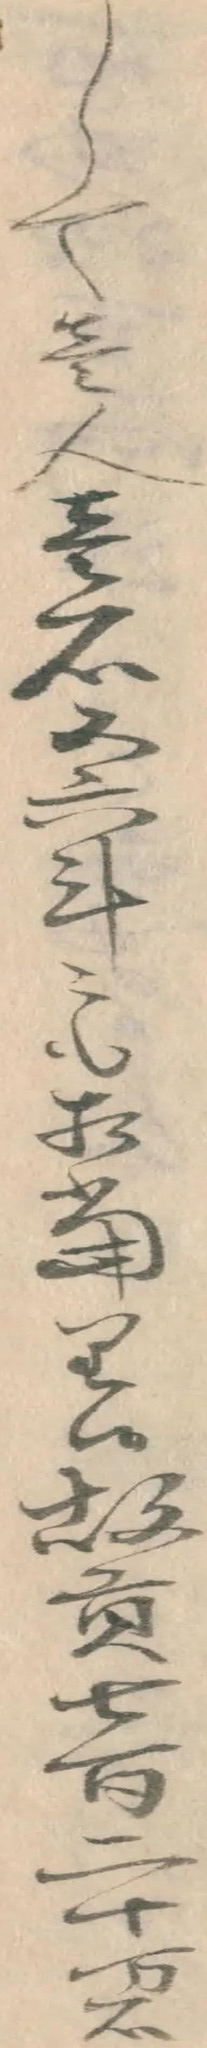して壱人壱石五六斗にも相当り候故貢七百二十万石
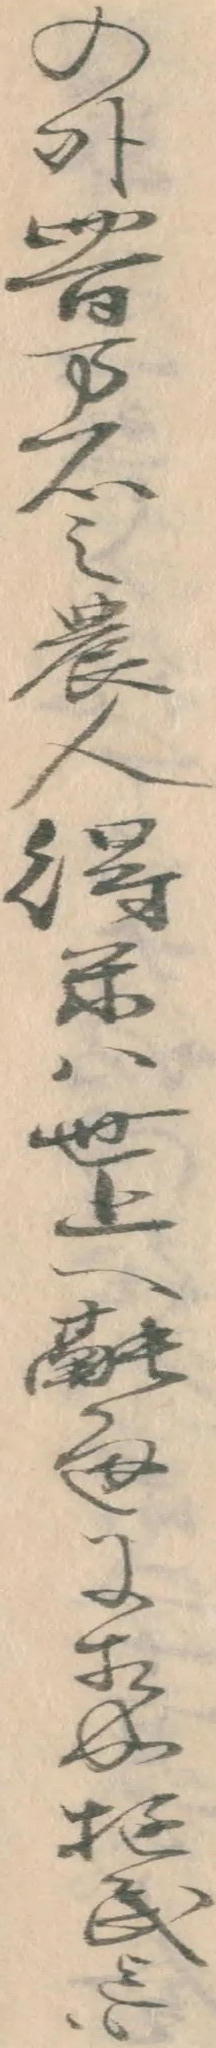の外四百万石之農人得米は世上へ融通に相成遊民迄も
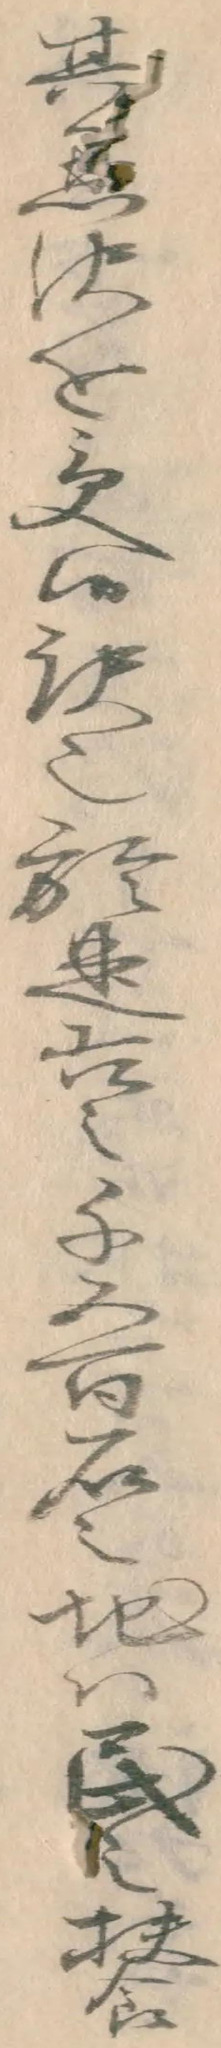其恩沢を受候訳也於是古之千五百石之地は民之扶食
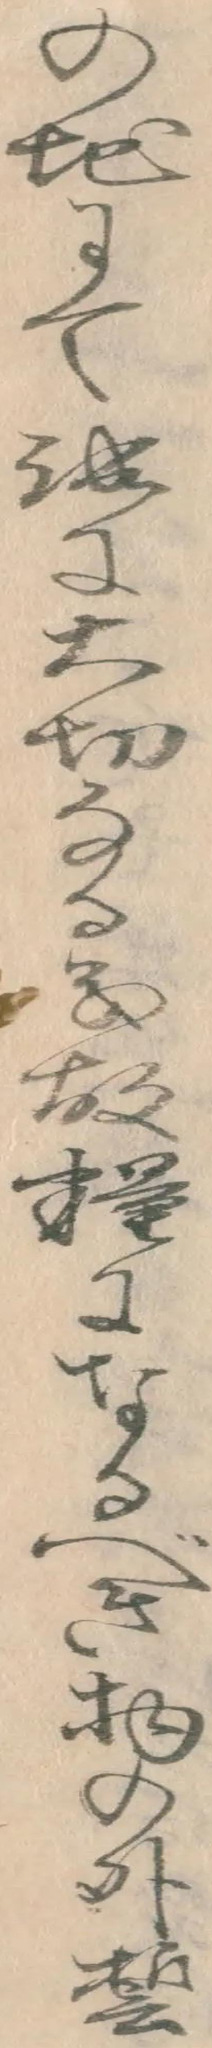の地にて誠に大切なる義故糧になるべき物の外誓
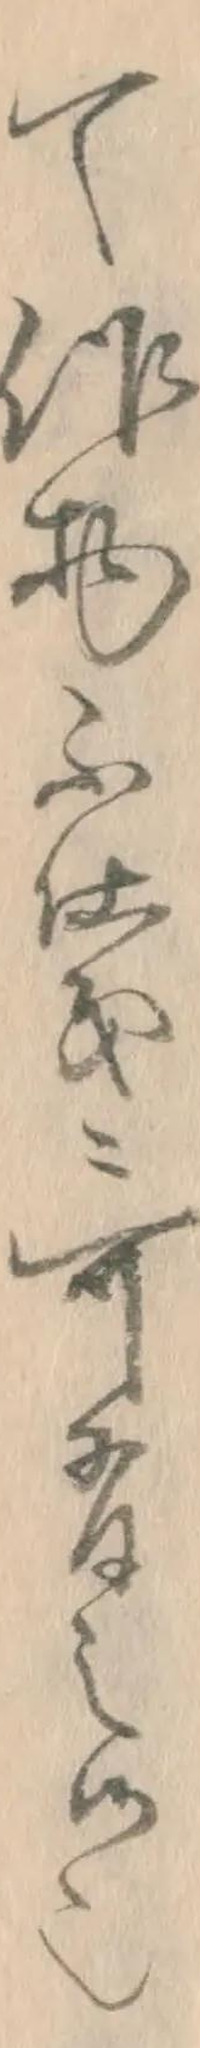て作物不仕義に可有之候也
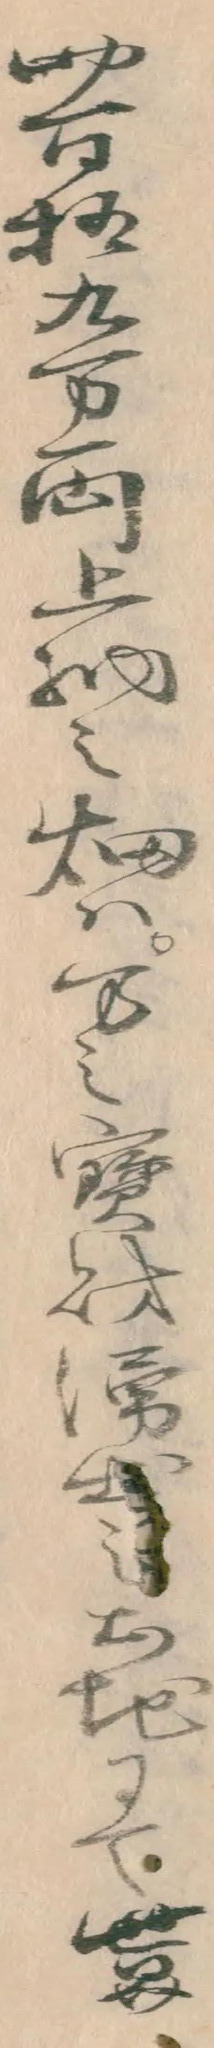一四百拾九万両上納之畑は°万之宝財湧出之土地にて世界
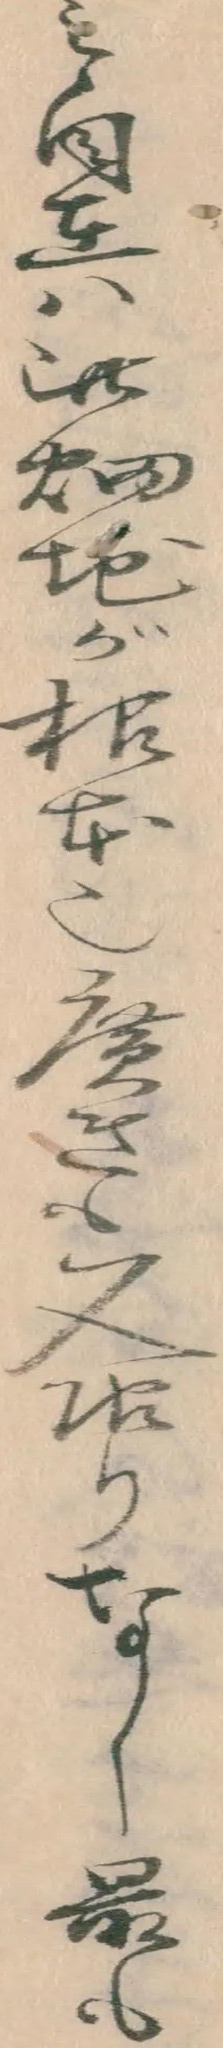之自在は此畑地が根本也広きも又限りなし最も
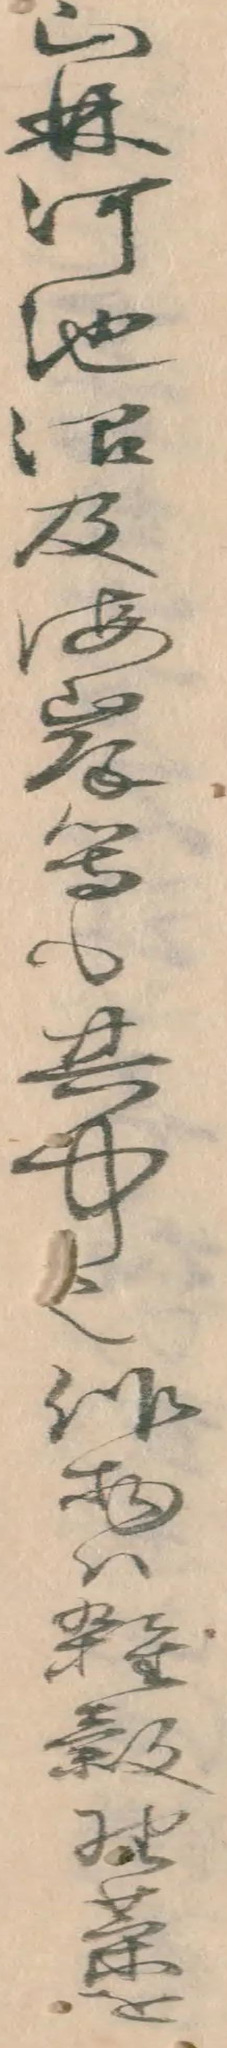山林河池沼及海岸等も其中也作物は雑穀野菜を
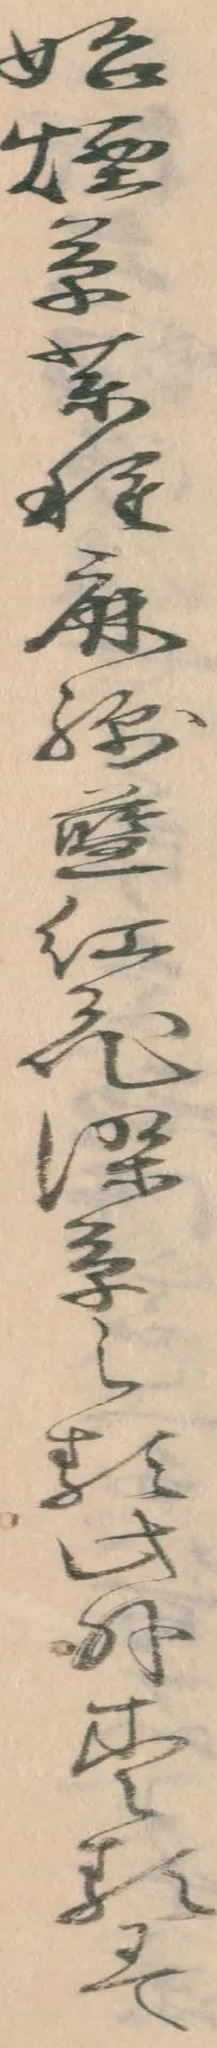始煙草薬種麻綿藍紅花染草之類此外木の類にて
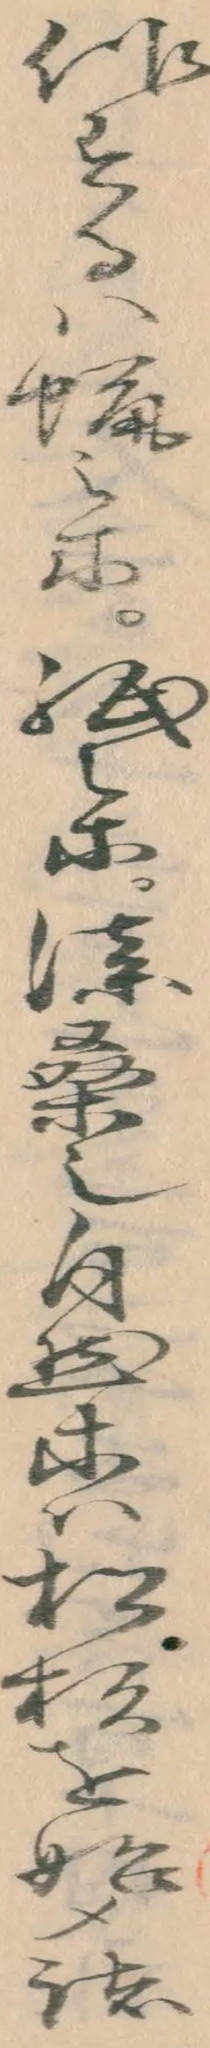作するは蝋之木°紙之木°漆桑也自然木は松杉を始め諸
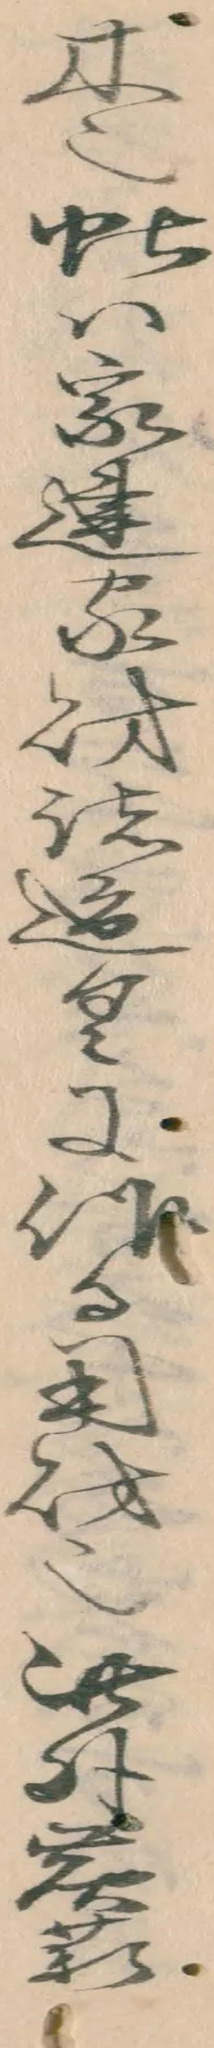木也此は家建家財諸道具に作る用材也此外炭薪
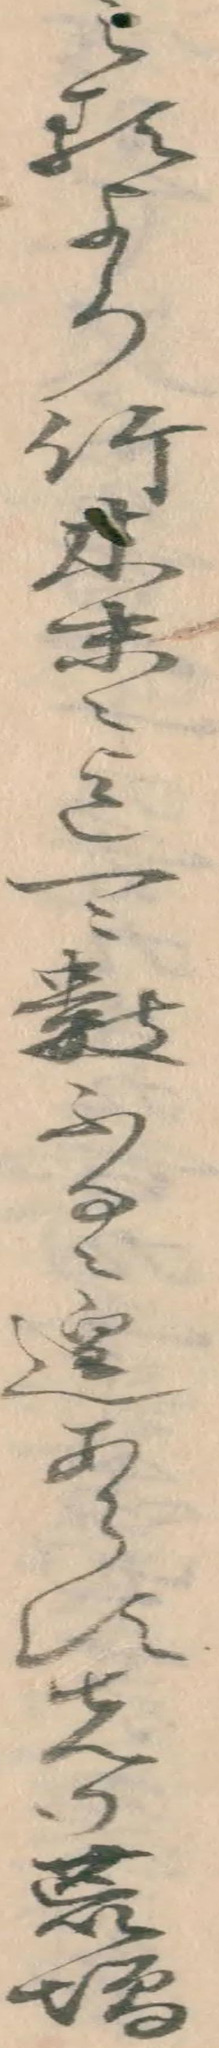之類より竹木末々迄一々数ふるに遑あらす先つ荒増
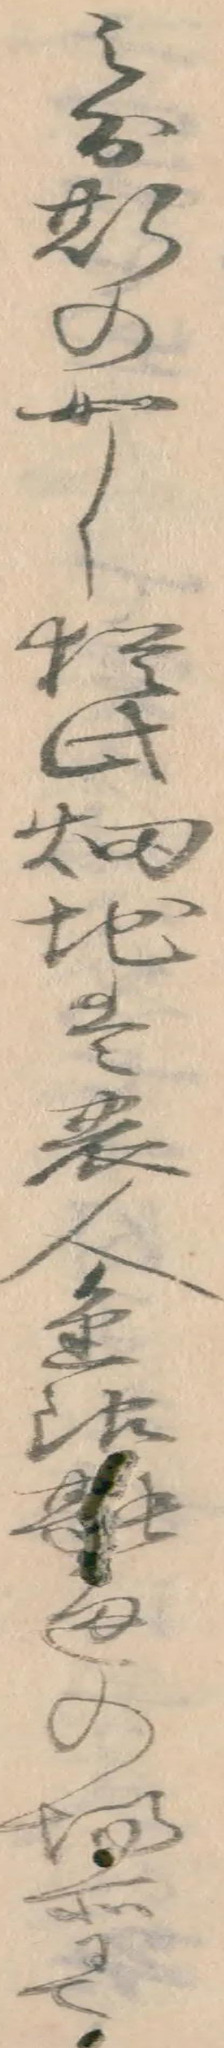之分斯の如く猶此畑地は農人金銀融通の場所にて
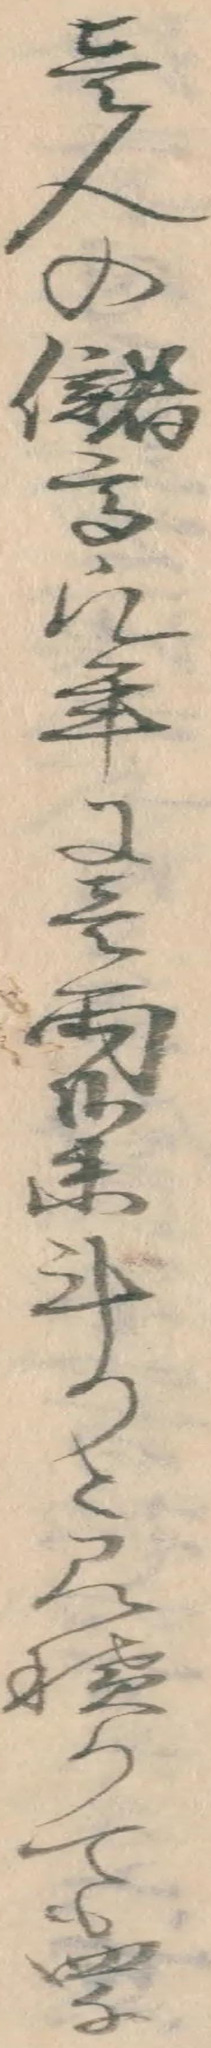壱人の儲高凡年に壱両弐朱計りと見積りても四千
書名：斎庭之穂
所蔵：国立国会図書館 National Diet Library, JAPAN
